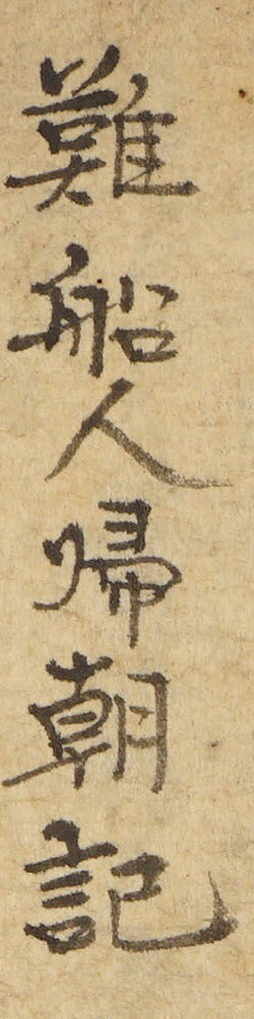難船人帰朝記

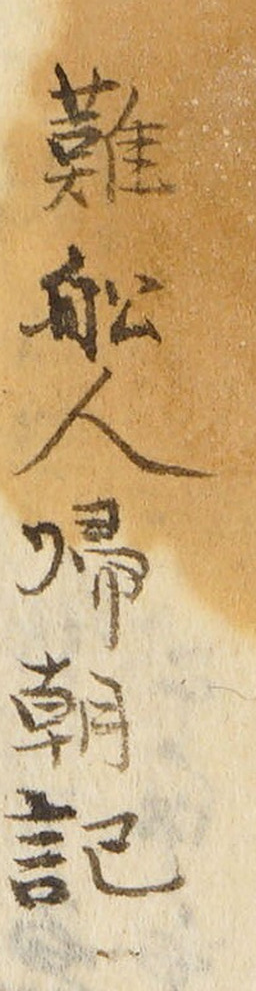難舩人帰朝記
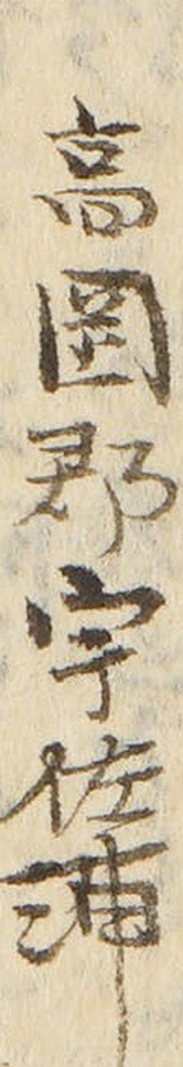高岡郡宇佐浦
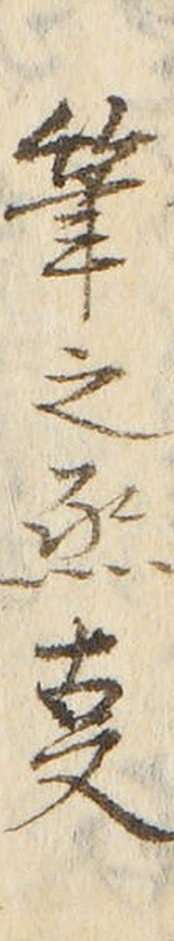筆之丞事
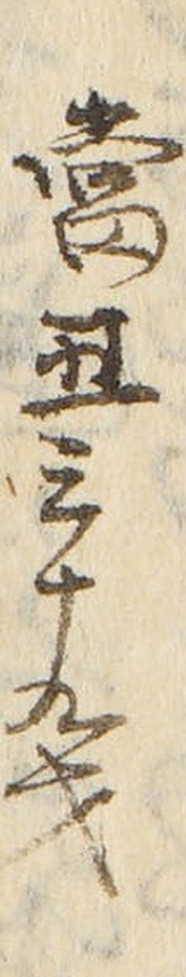當丑三十九歳
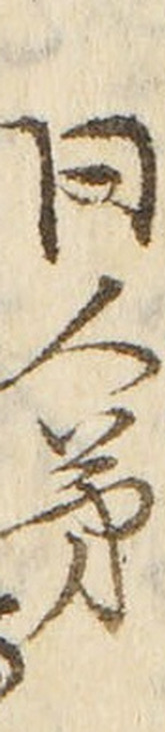同人弟
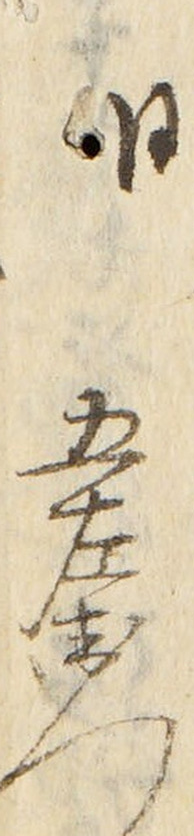同五左衛門
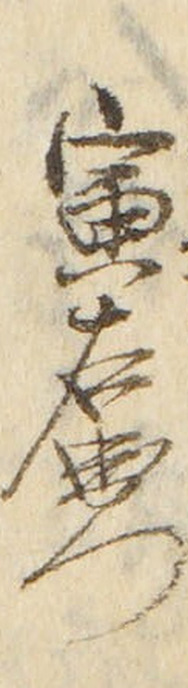寅右衛門
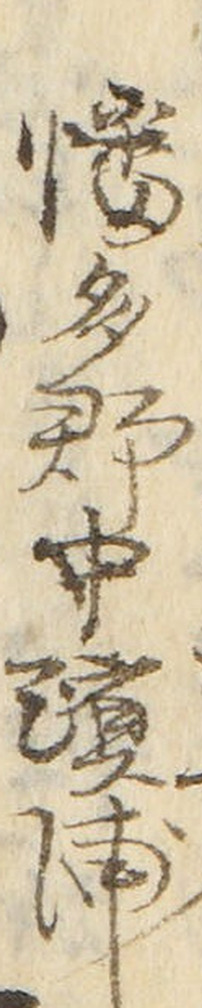幡多郡中濱浦
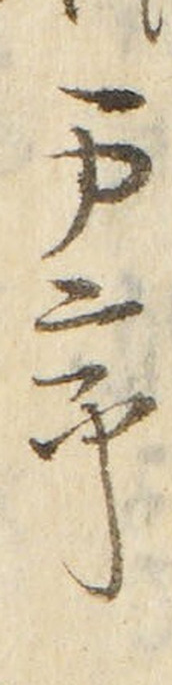万二郎
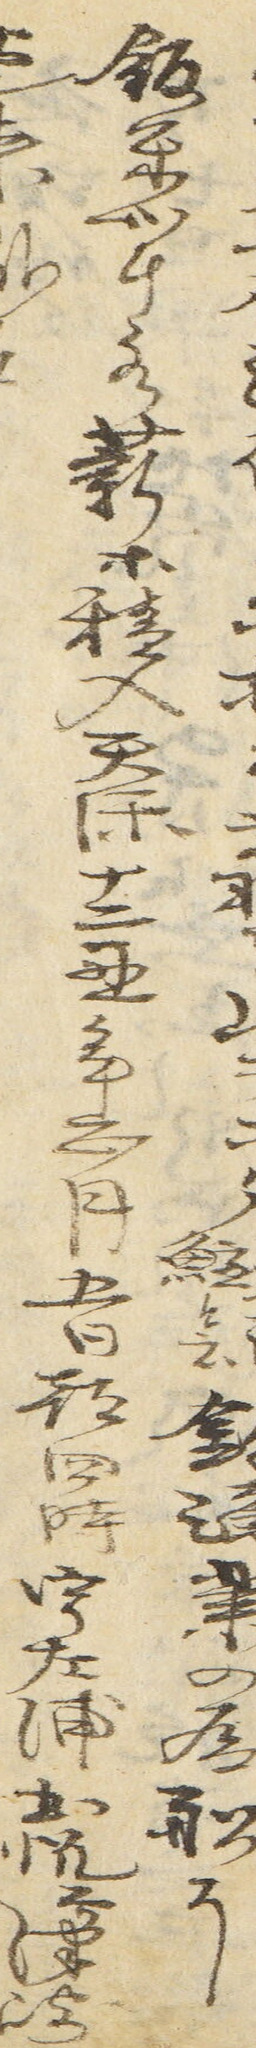飯米弐斗水薪等積入天保十二丑年正月五日朝四時宇佐浦出帆而津崎
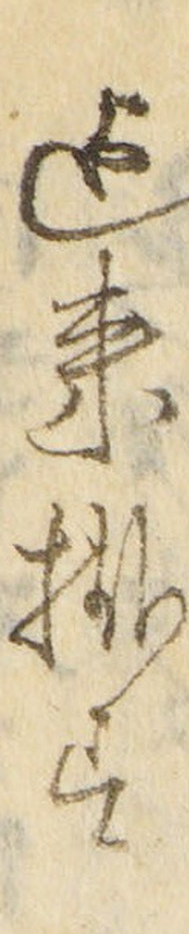迄来掛す

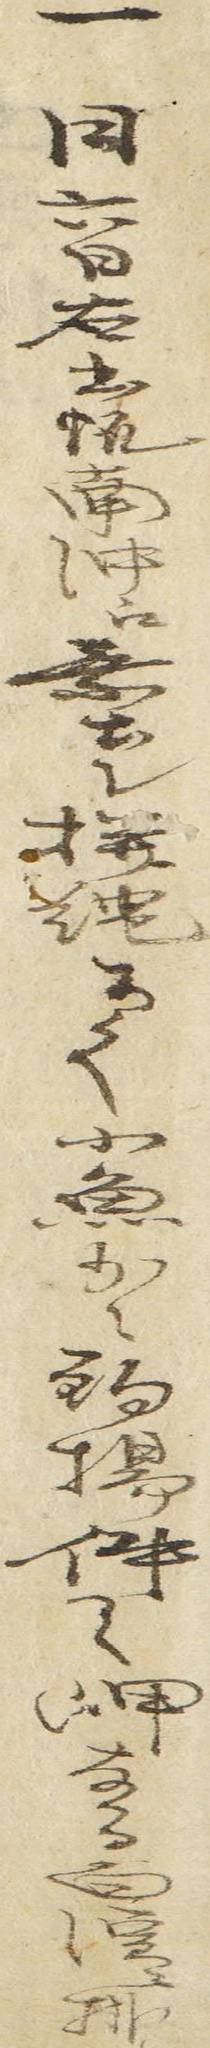一同六日右出帆南沖江乗出し拼縄にて小魚少々釣揚件之岬なる白濱に掛り
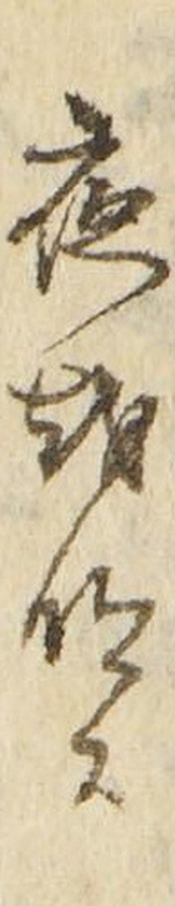夜を明ス
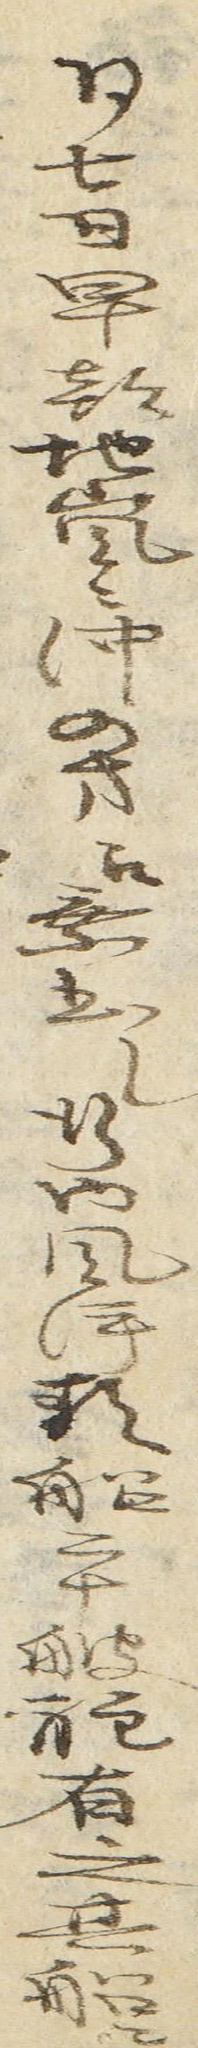一同七日早朝地嵐に沖の方江乗出し行内風泙類船二十艘程有之其船々
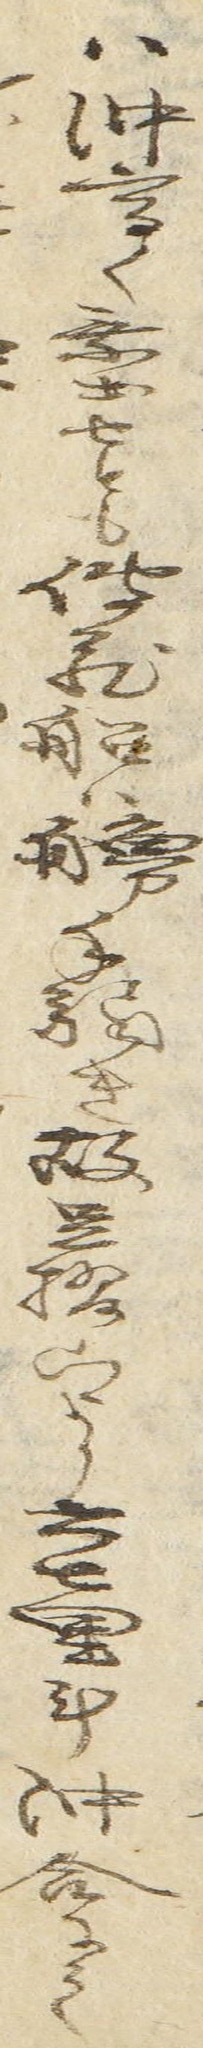は沖高く乗出せとも伝蔵船は艪手弱き故足摺山より六七里計沖合にて
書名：難船人帰朝記
